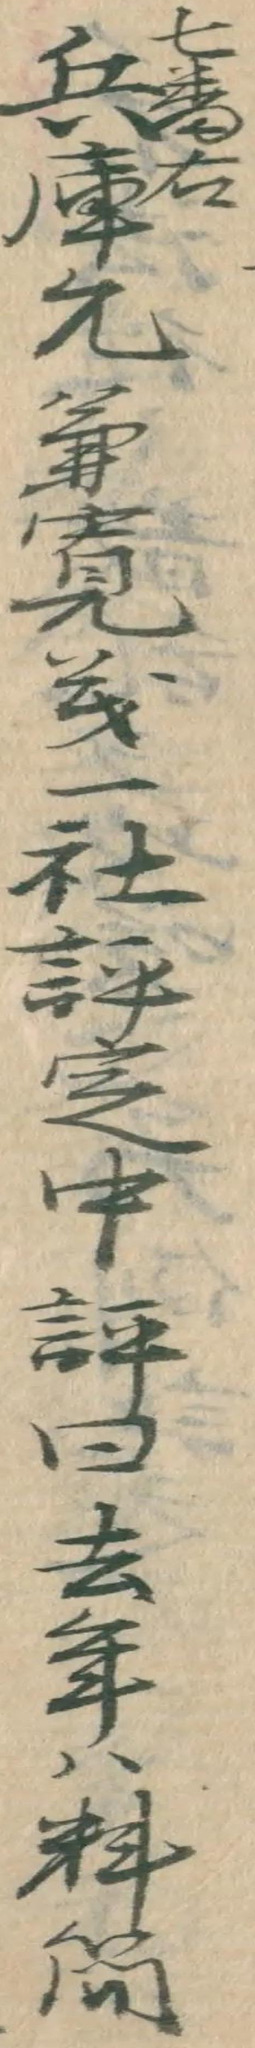兵庫允兼寛義一社評定中評曰去年ハ料簡
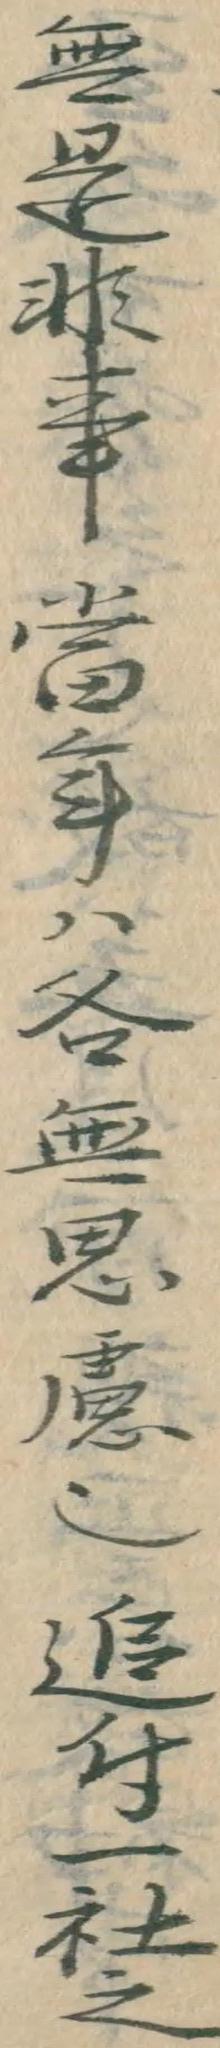無是非事当年ハ各無思慮也追付一社之

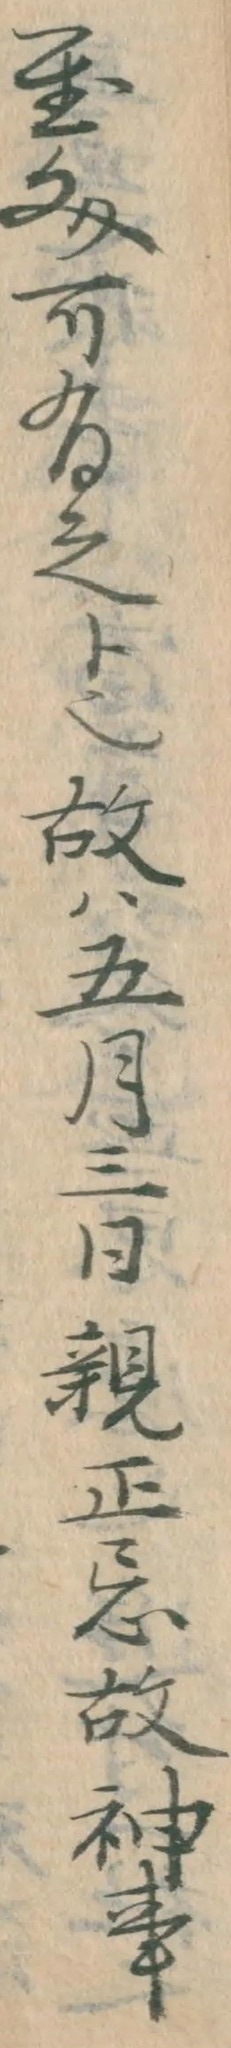至処可有之ト也故ハ五月三日親正忌故神事
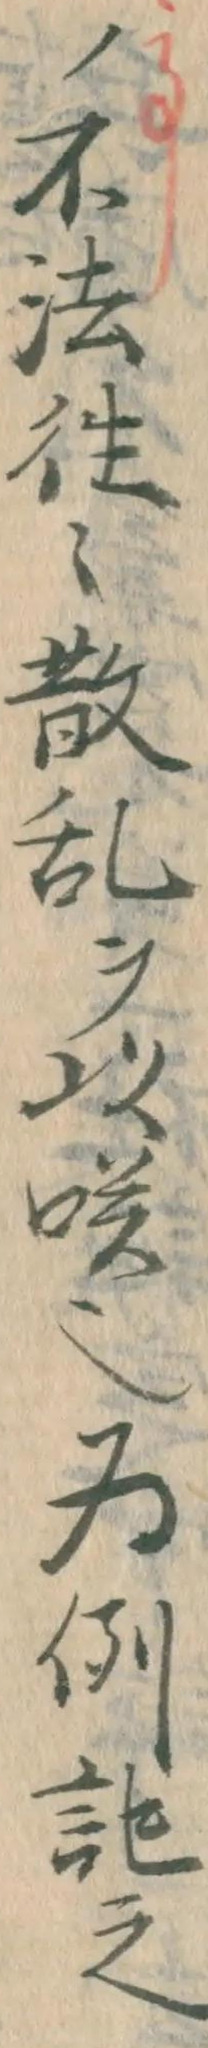ノ不法往々散乱ヲ以咲也為例記之
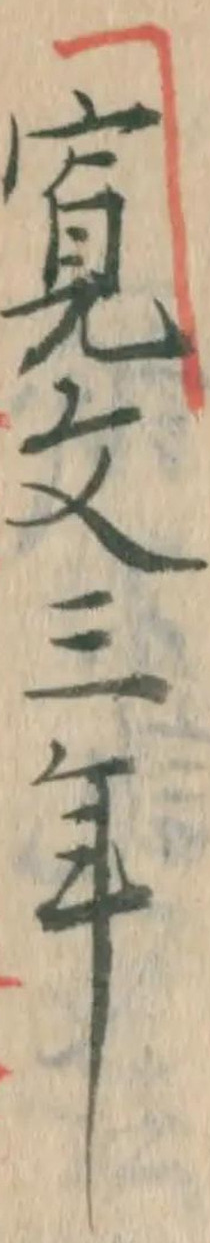寛文三年
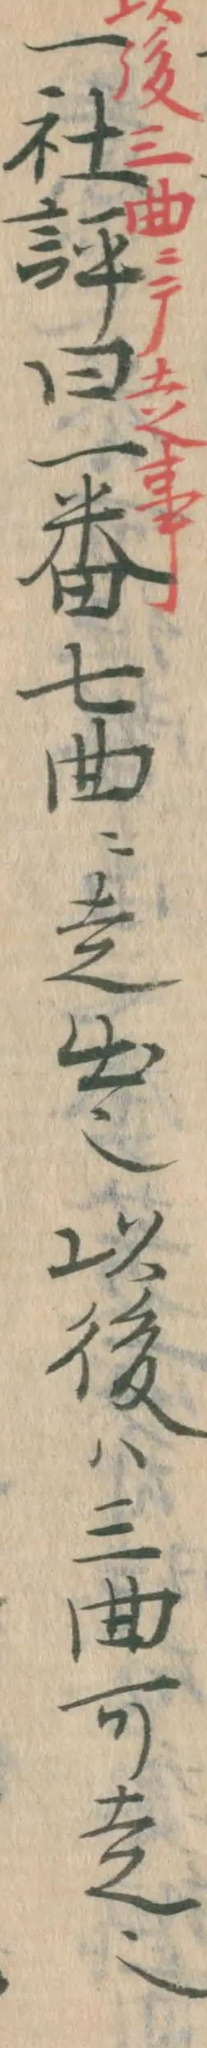一社評曰一番七曲ニ走出也以後ハ三曲可走也
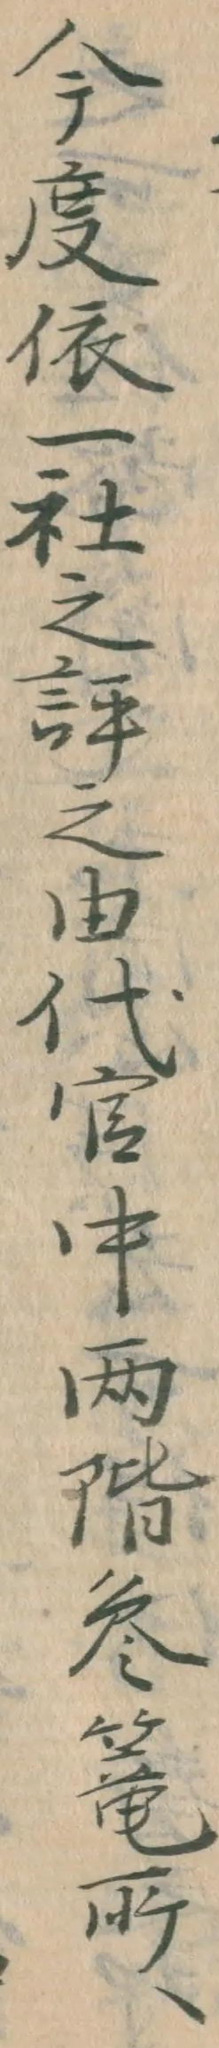今度依一社之評之由代官中両階参篭所ヘ
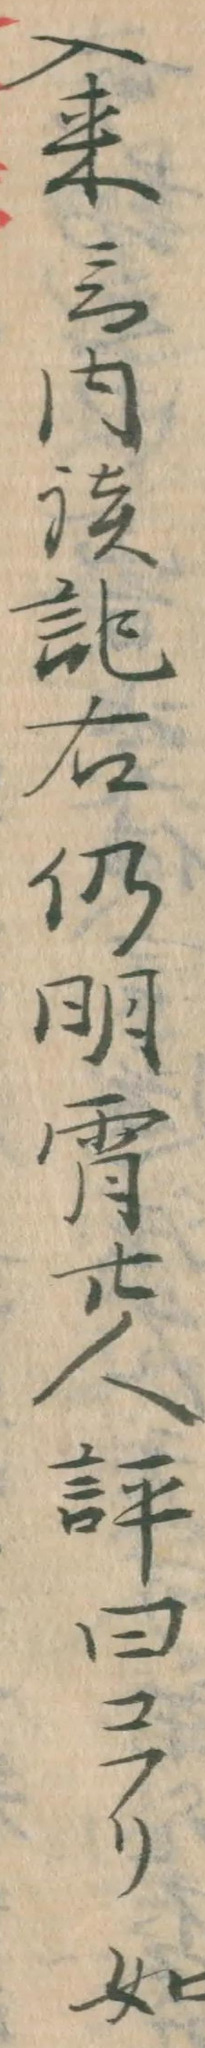入来ニ而内談記右仍明宵廿人評曰コフリ如
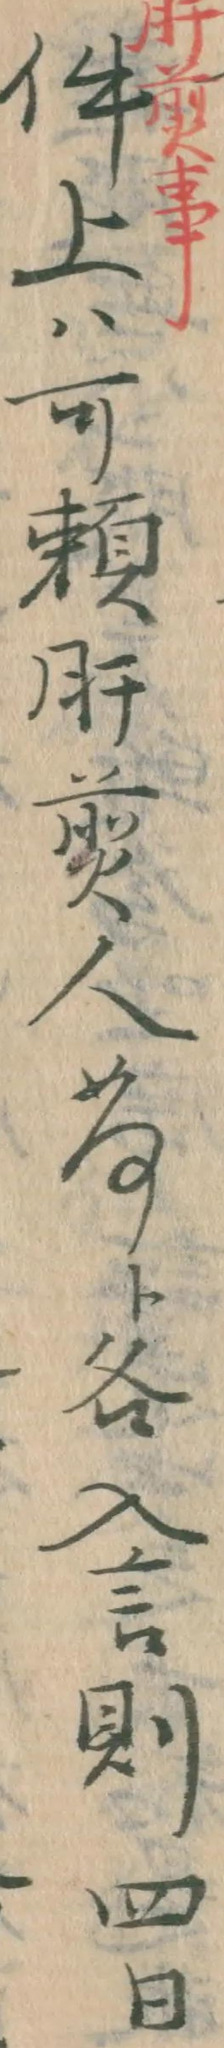件上ハ可頼肝煎人如何ト各入言則四日
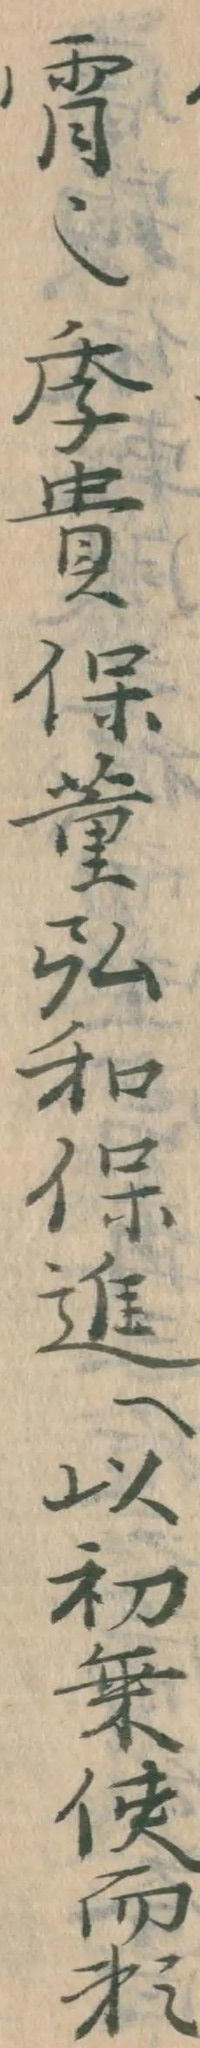宵也季貴保童弘和保進へ以初乗使而頼
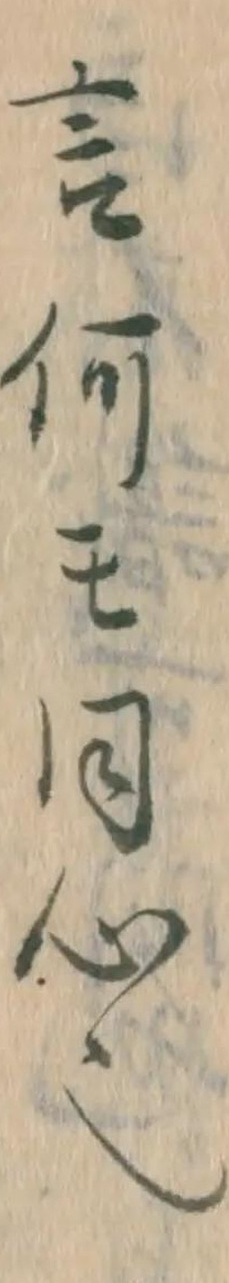言何モ同心也
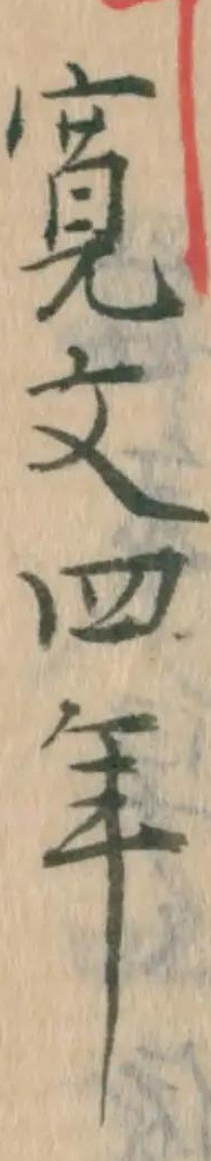寛文四年
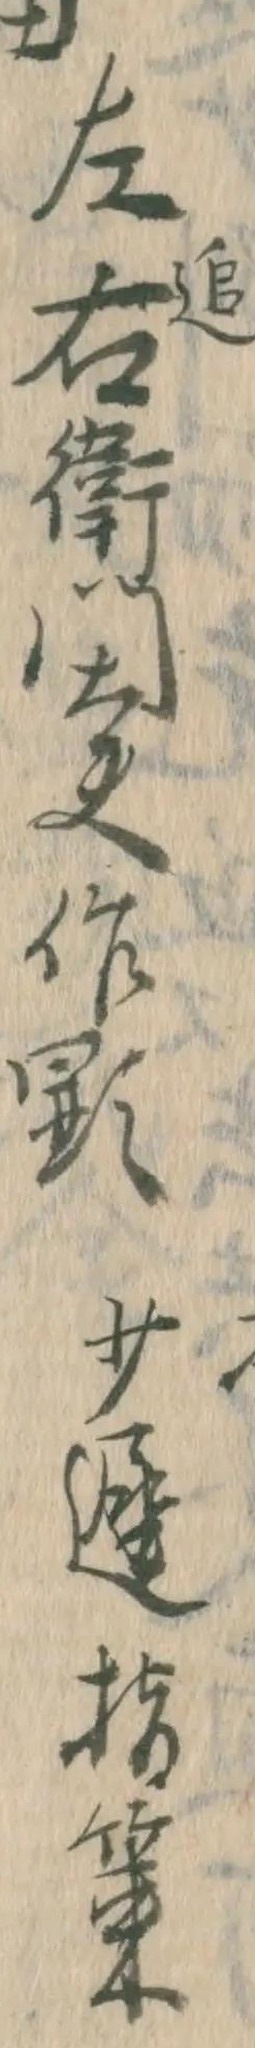左右衛門大夫作野少遅指策
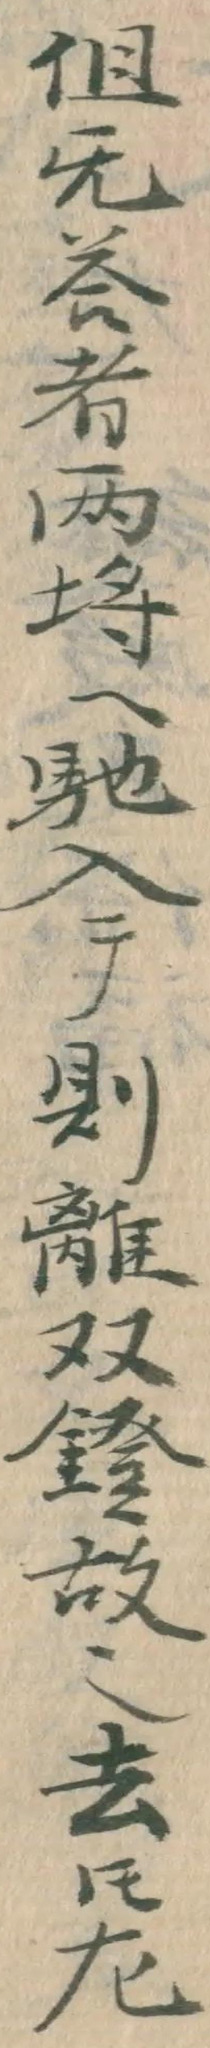但旡答者両埒へ馳入テ則離双鐙故也去トモ左
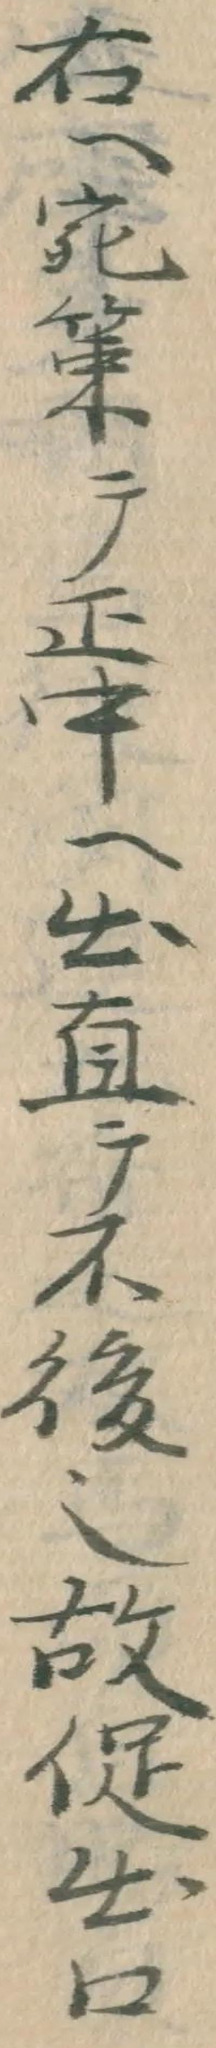右へ宛策テ正中へ出直テ不後也故促出口
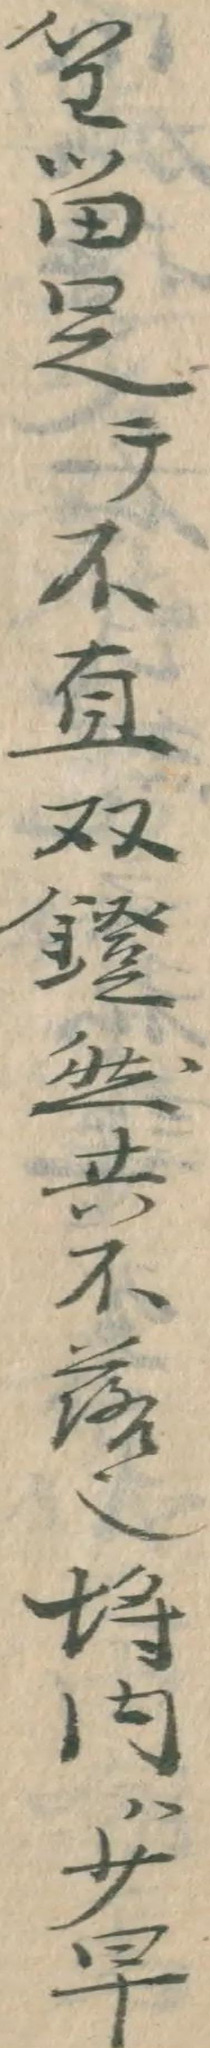望留足テ不直双鐙然共不落也埒内ハ少早
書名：賀茂社記録. 第10冊
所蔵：国立国会図書館 National Diet Library, JAPAN
